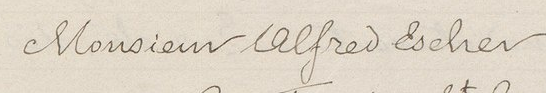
Monsieur Alfred Escher
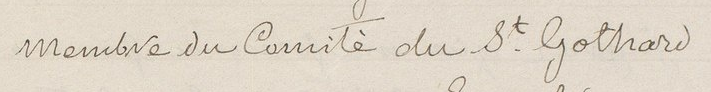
Membre du Comité du St Gothard.
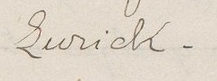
Zurich.
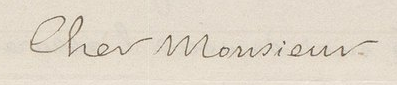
Cher Monsieur
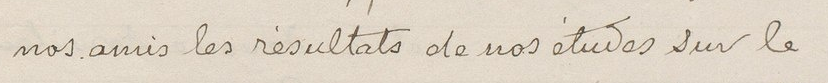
nos amis les résultats de nos études sur le
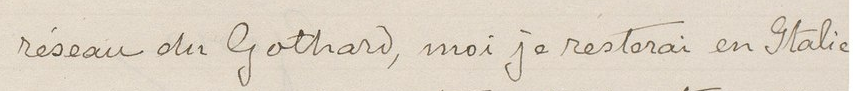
réseau du Gothard, moi je resterai en Italie
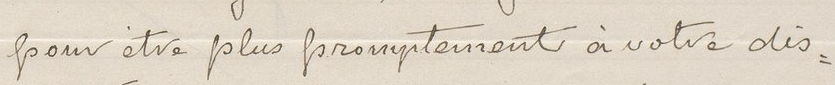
pour être plus promptement à votre dis-
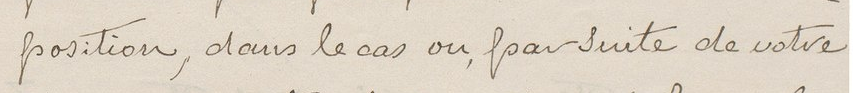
position, dans le cas ou, par suite de votre
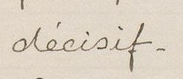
décisif.
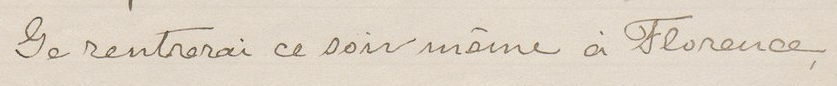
Je rentrerai ce soir même à Florence,
